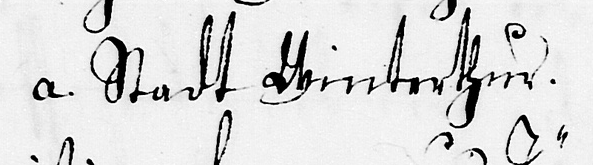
a. Stadt Winterthur.
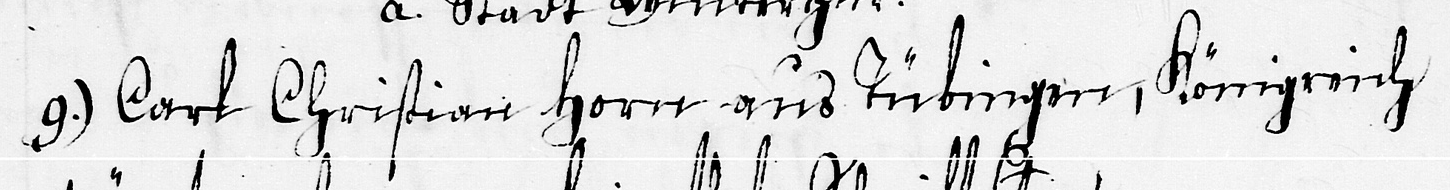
9.) Carl Christian Horn aus Tübingen, Königreich
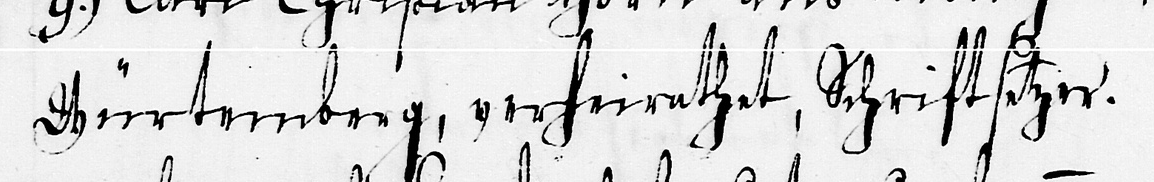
Würtemberg, verheirathet, Schriftsetzer.
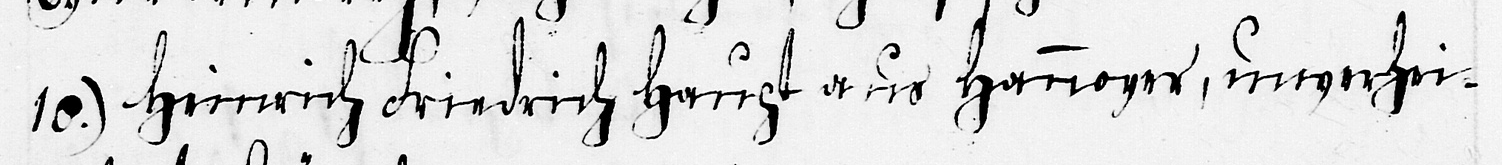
10.) Heinrich Friedrich Haupt aus Hannover, unverhei¬
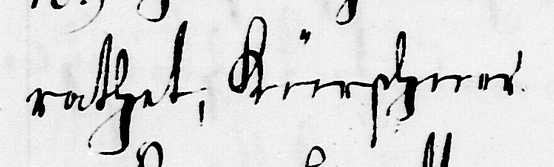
rathet, Kürschner.
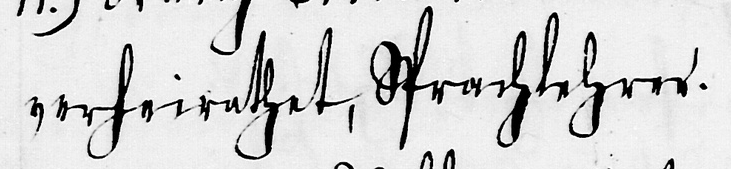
verheirathet, Sprachlehrer.
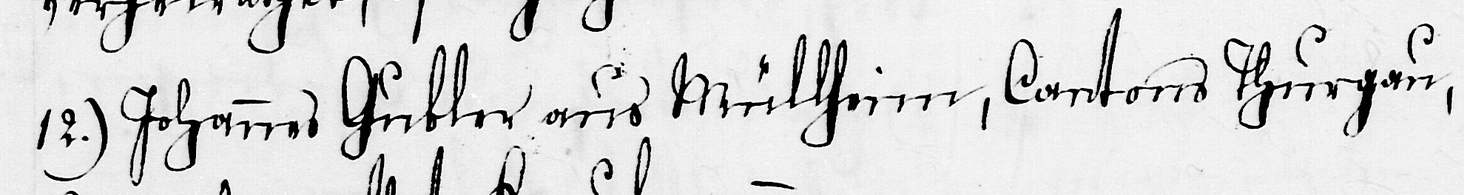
12.) Johannes Gubler aus Müllheim, Cantons Thurgau,
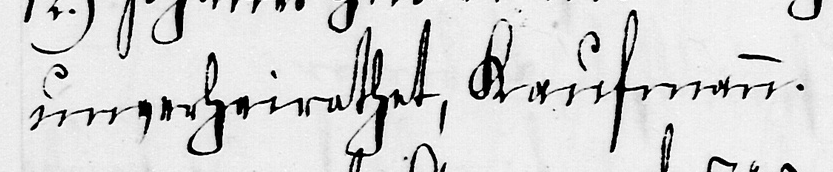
unverheirathet, Kaufmann.
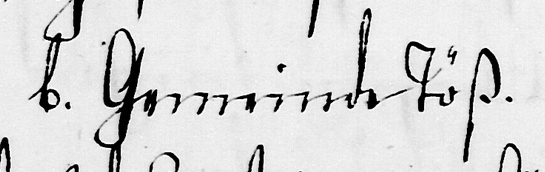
b. Gemeinde Töß.
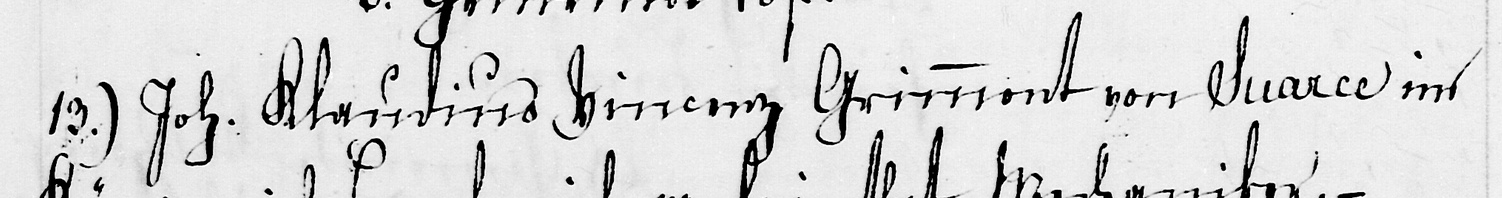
13.) Joh. Klaudius Vincenz Grimmont von Suarce im
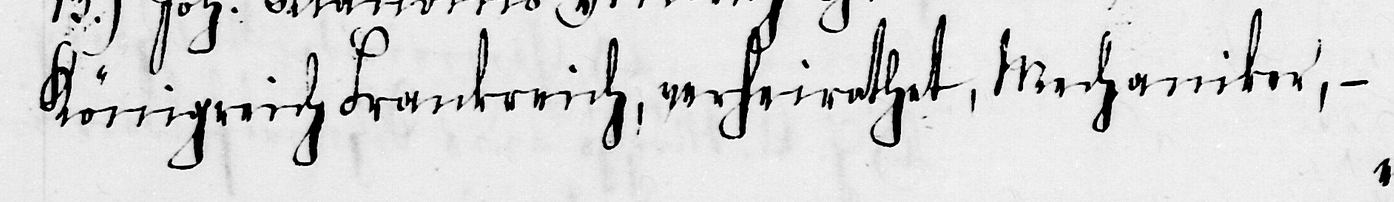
Königreich Frankreich, verheirathet, Mechaniker, –
